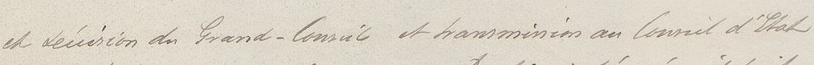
et décision du Grand-Conseil et transmission au Conseil d'Etat
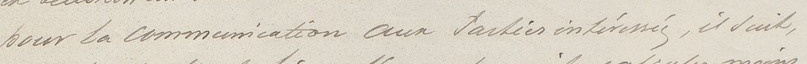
pour la communication aux Parties intéressés, il suit,
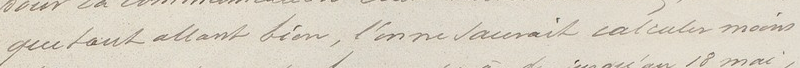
que tout allant bien , l'on ne saurait calculer moins
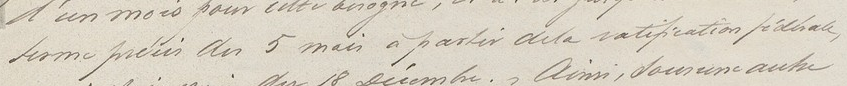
terme précis des 5 mois à partir dela ratification fédérale,
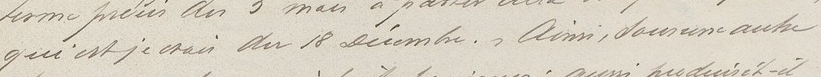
qui est je crois du 18 Décembre. – Ainsi, sous une autre
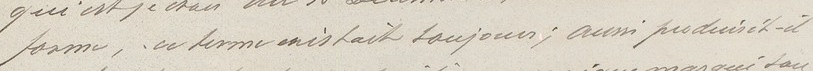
forme, ce terme existait toujours; aussi produisit-il
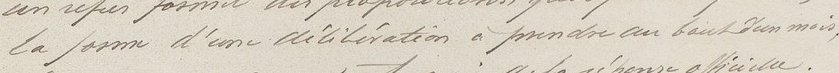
la forme d'une délibération à prendre au bout d'un mois,
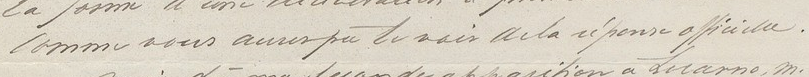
comme vous aurez pû le voir de la réponse officielle.
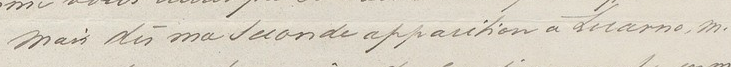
Mais dès ma seconde apparition à Locarno, M.
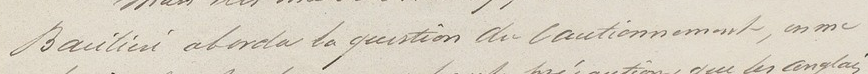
Bacilieri aborda la question du cautionnement, en me
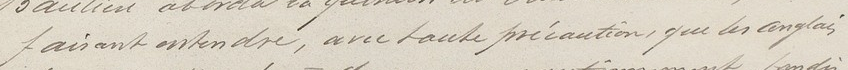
faisant entendre, avec toute précaution, que les Anglais
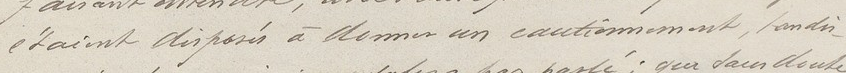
étaient disposés à donner un cautionnement, tandis-
